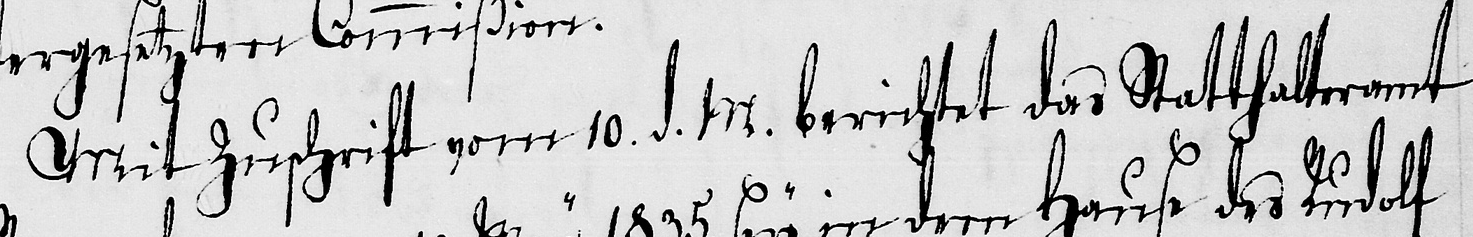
Mit Zuschrift vom 10. d. M. berichtet das Statthalteramt
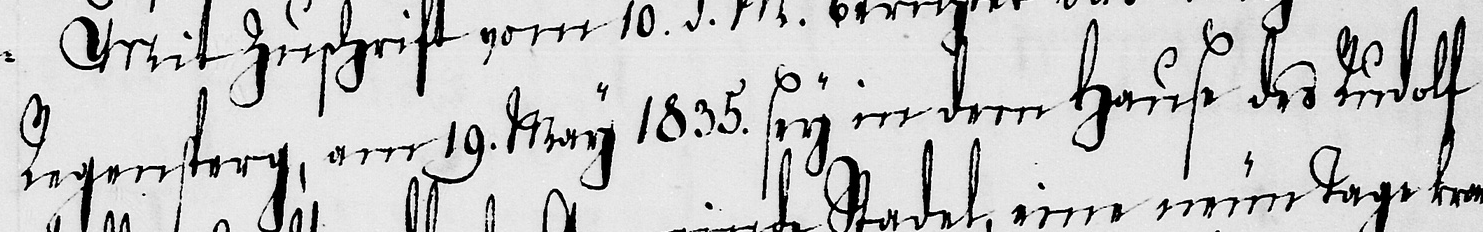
Regensperg, am 19. May 1835. sey in dem Hause des Rudolf
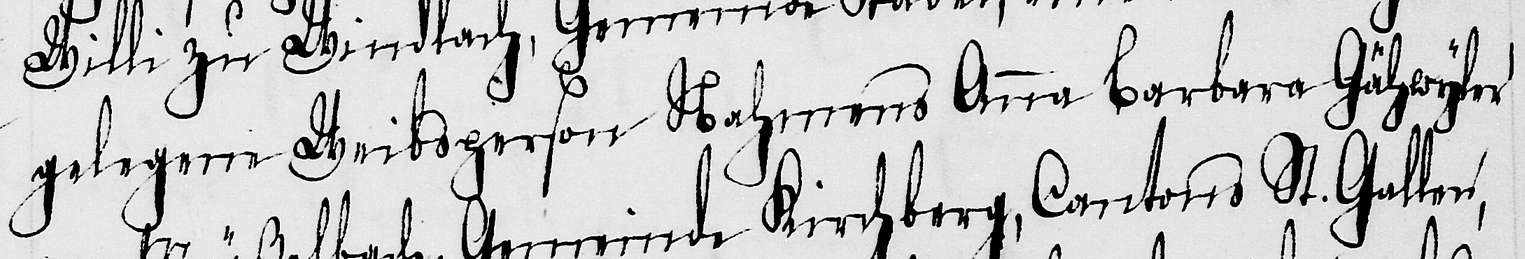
gelegene Weibsperson Nahmens Anna Barbara Gähwyler
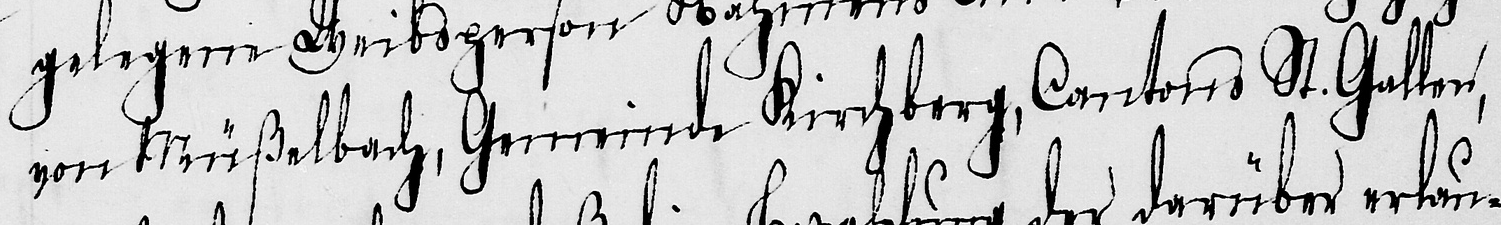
von Müßelbach, Gemeinde Kirchberg, Cantons St. Gallen,
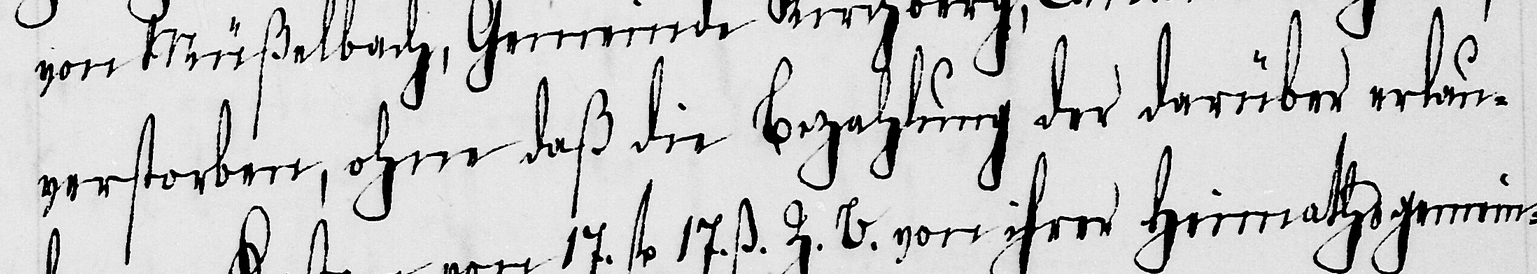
verstorben, ohne daß die Bezahlung der darüber erlau¬
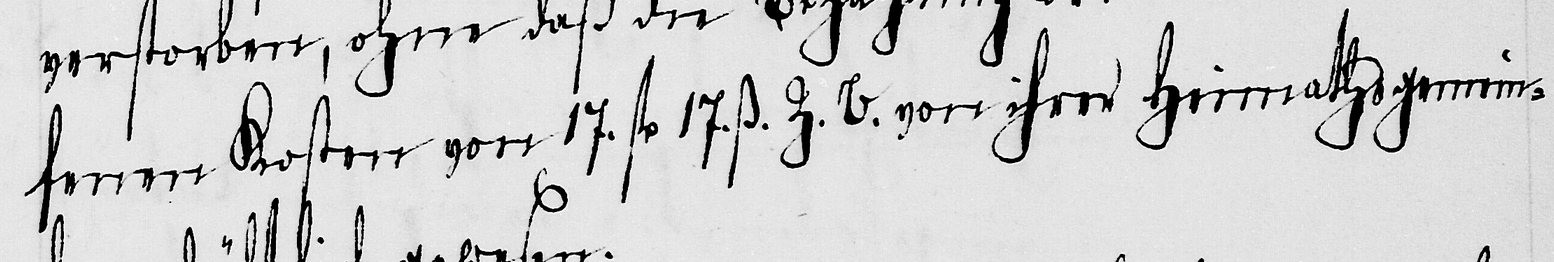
fenen Kosten von 17. fl. 17. ß. Z. V. von ihrer Heimathgemein¬
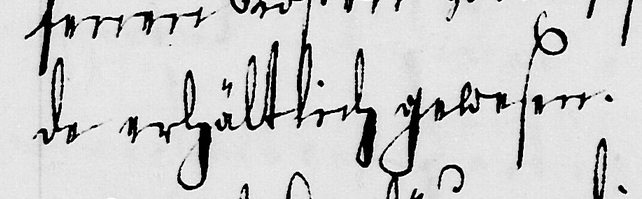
de erhältlich gewesen.
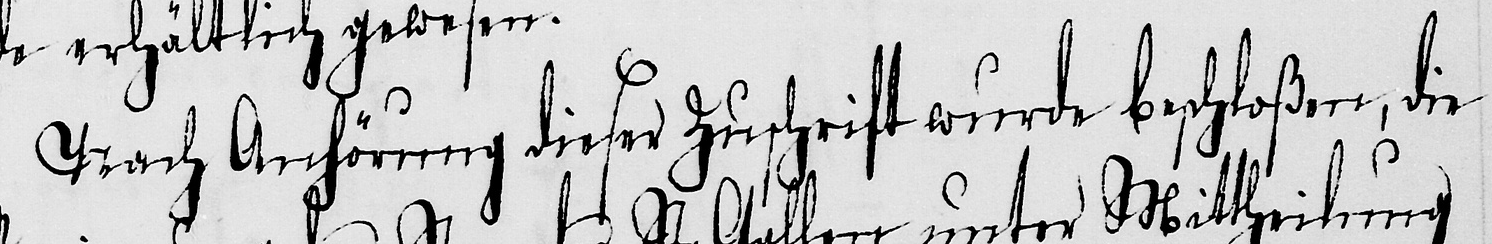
Nach Anhörung dieser Zuschrift wurde beschloßen, die
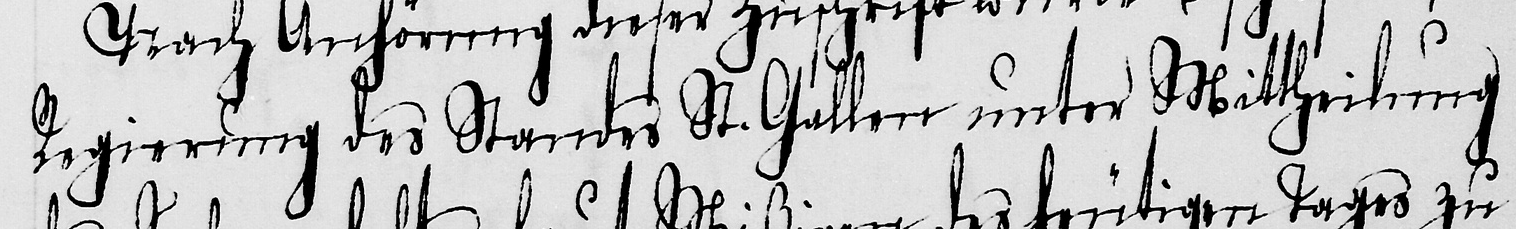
Regierung des Standes St. Gallen unter Mittheilung
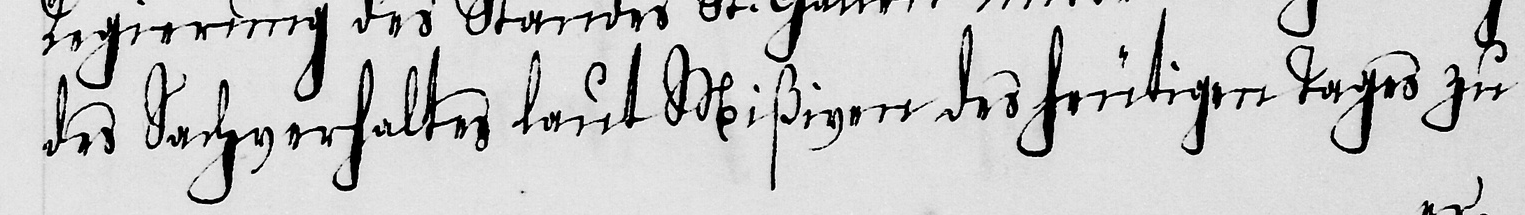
des Sachverhaltes laut Mißiven des heutigen Tages zu
